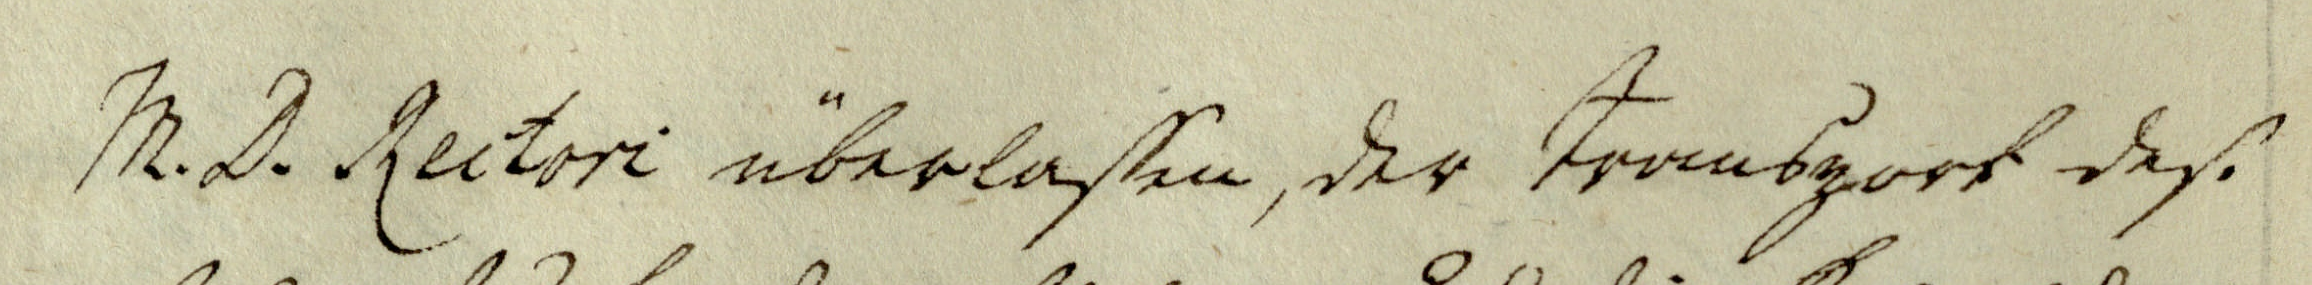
M. D. Rectori überlassen, der Transport des¬
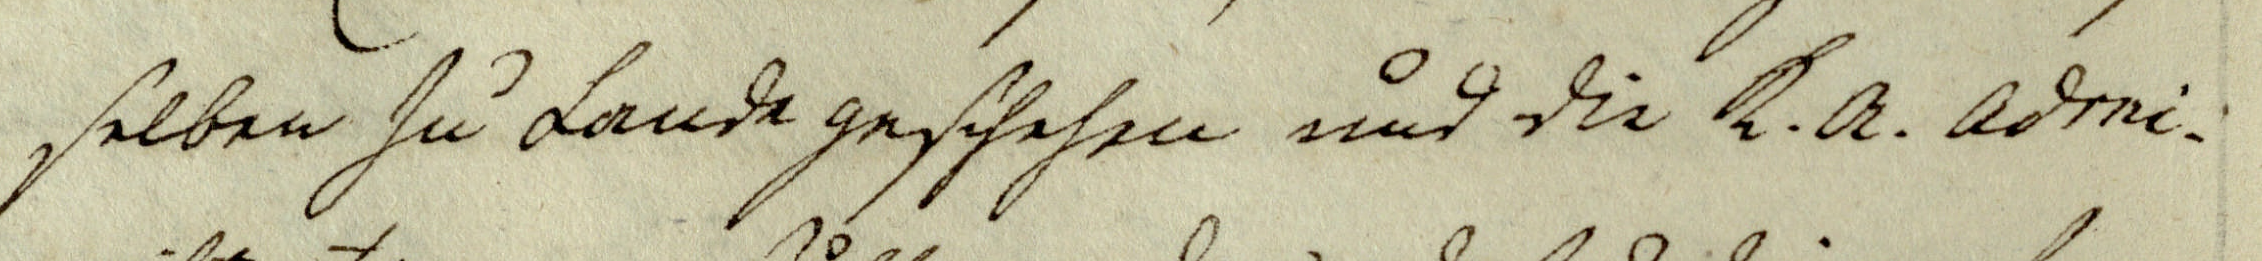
selben zu Lande geschehen und die K. A. Admi¬
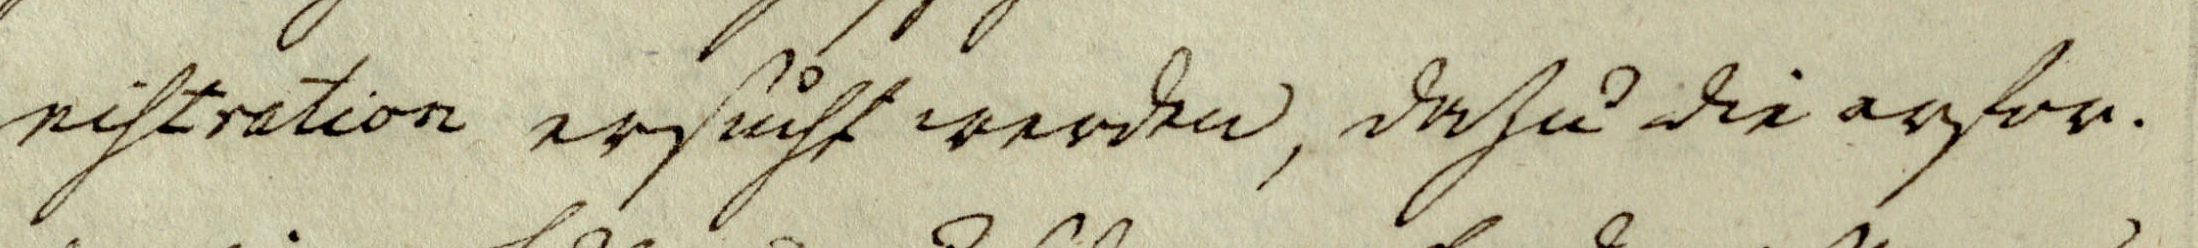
nistration ersucht werden, dazu die erfor¬
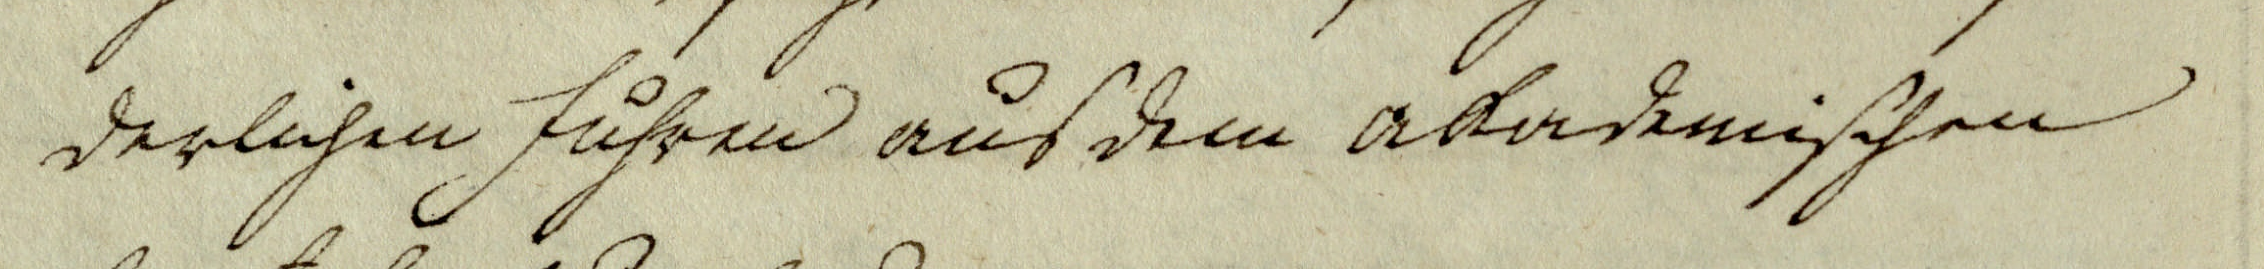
derlichen Fuhren aus dem akademischen
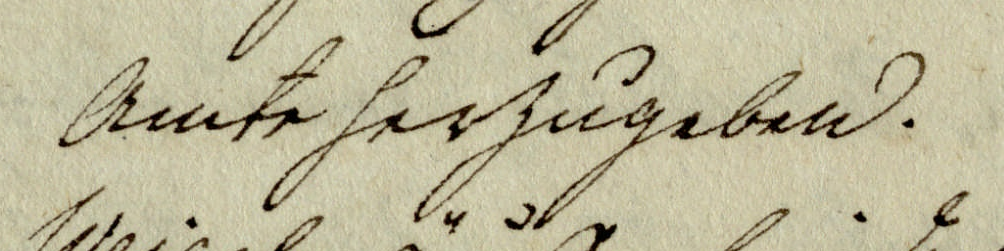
Amte herzugeben.
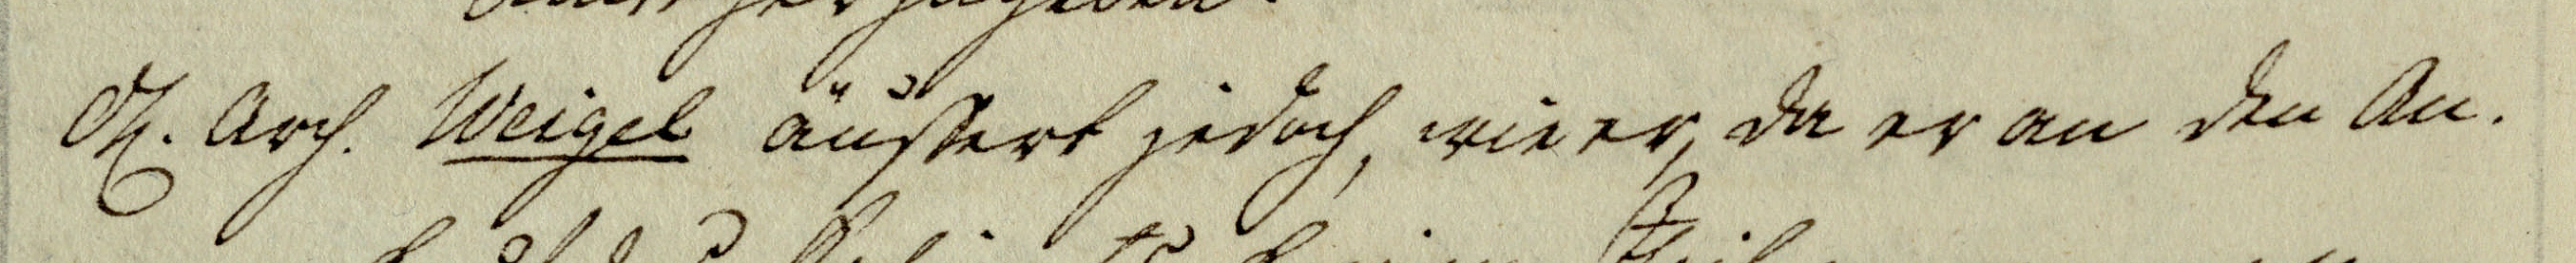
dh. Arch. Weigel äussert jedoch, wie er, da er an den An¬
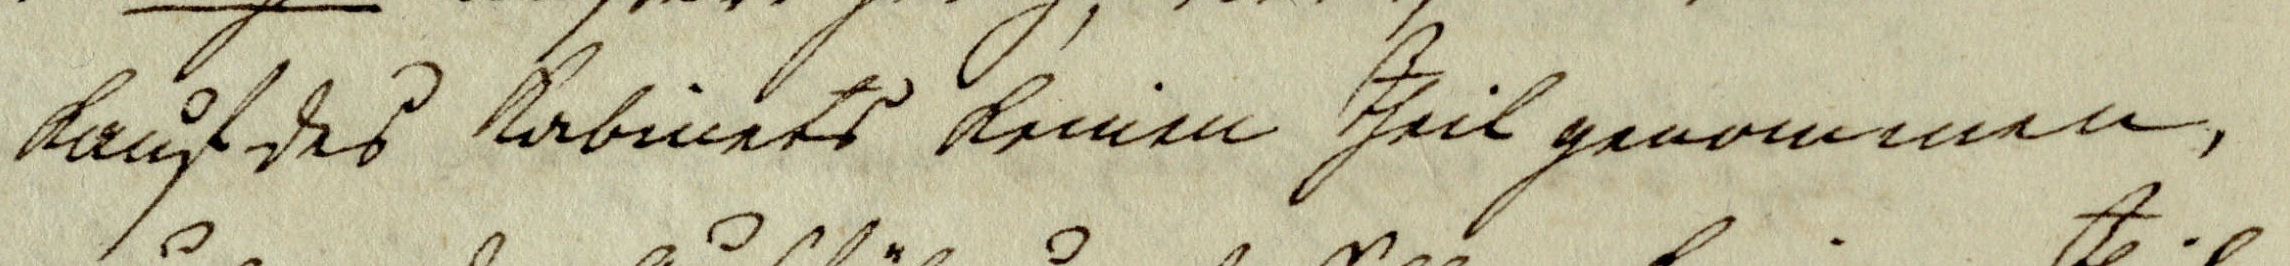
kauf des Kabinets keinen Theil genommen,
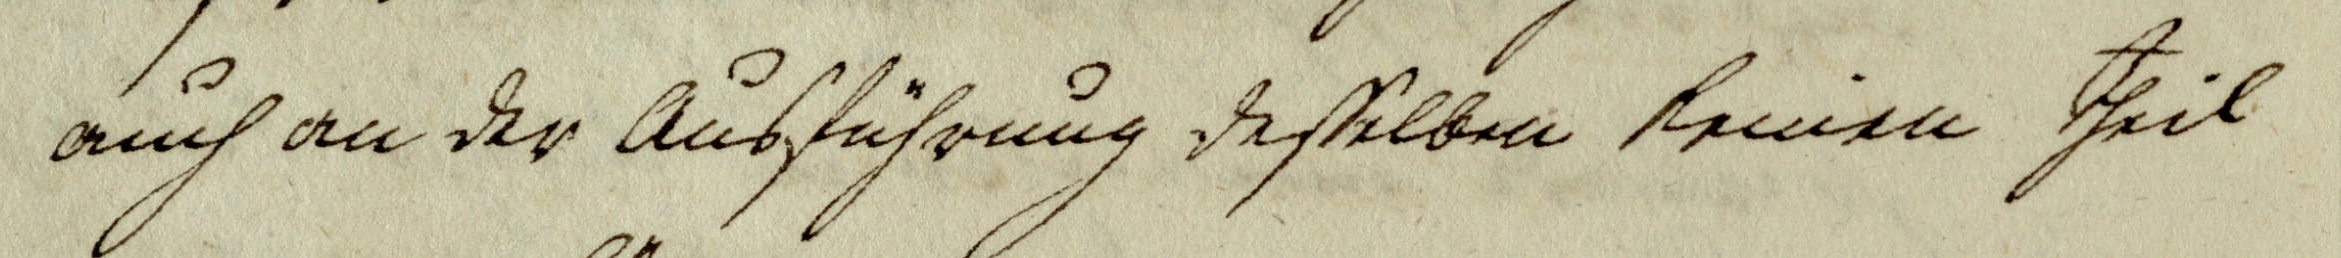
auch an der Ausführung desselben keinen Theil
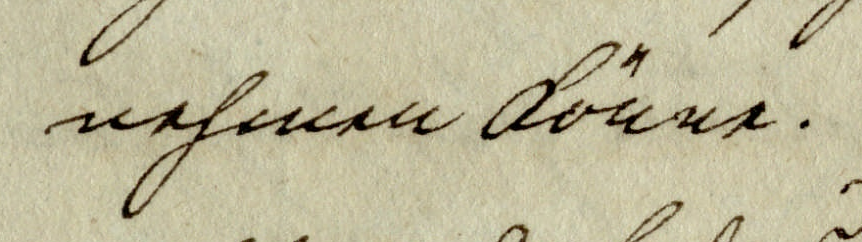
nehmen könne.
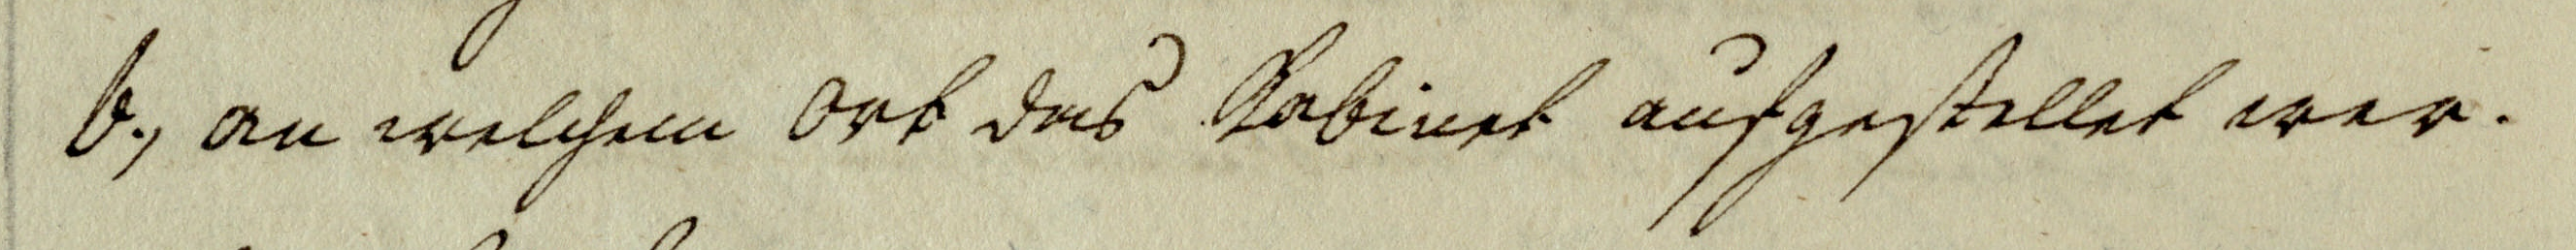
b., an welchem Ort das Kabinet ausgestellet wer¬
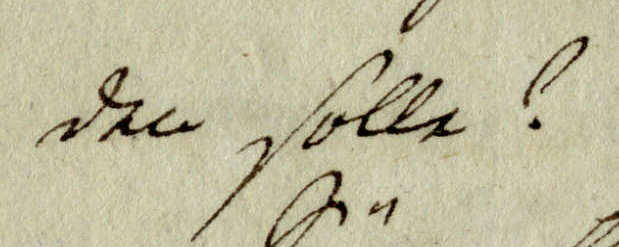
den solle?
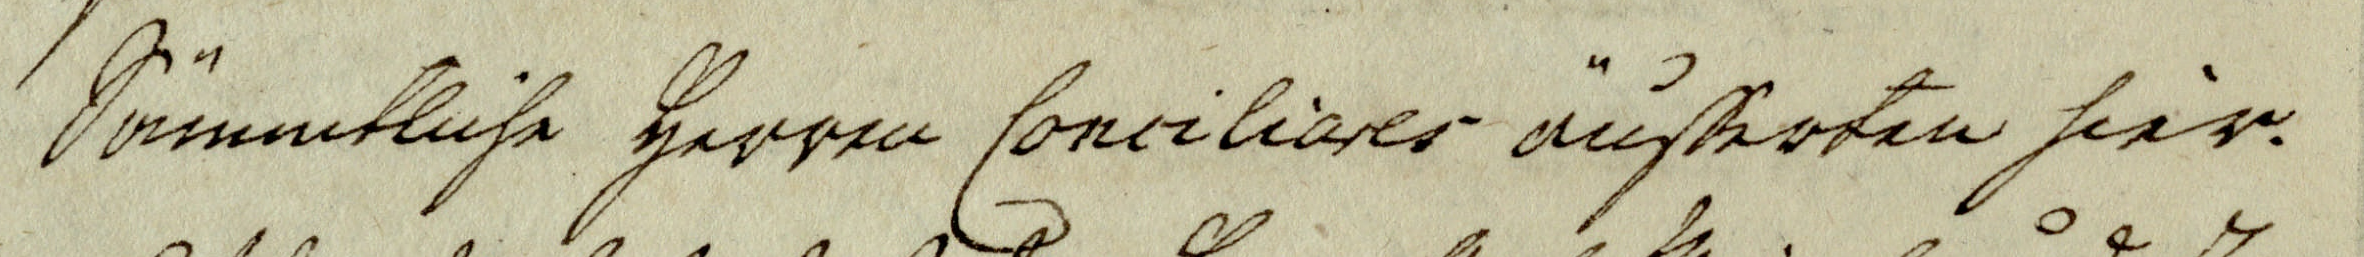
Sämmtliche Herren Conciliares äusserten hier¬
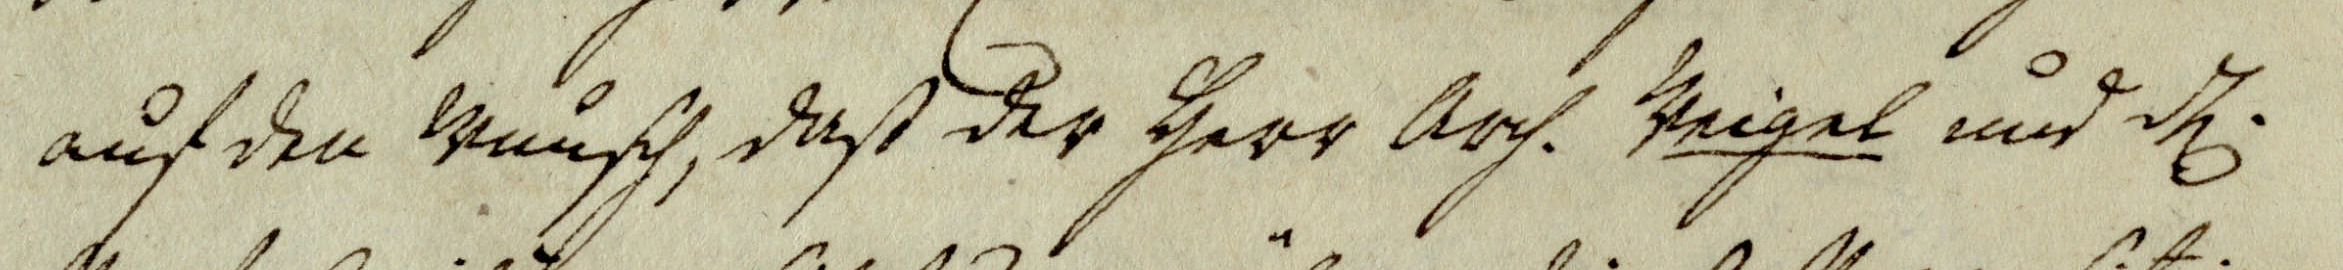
auf den Wunsch, daß der Herr Prof. Weigel und dh.
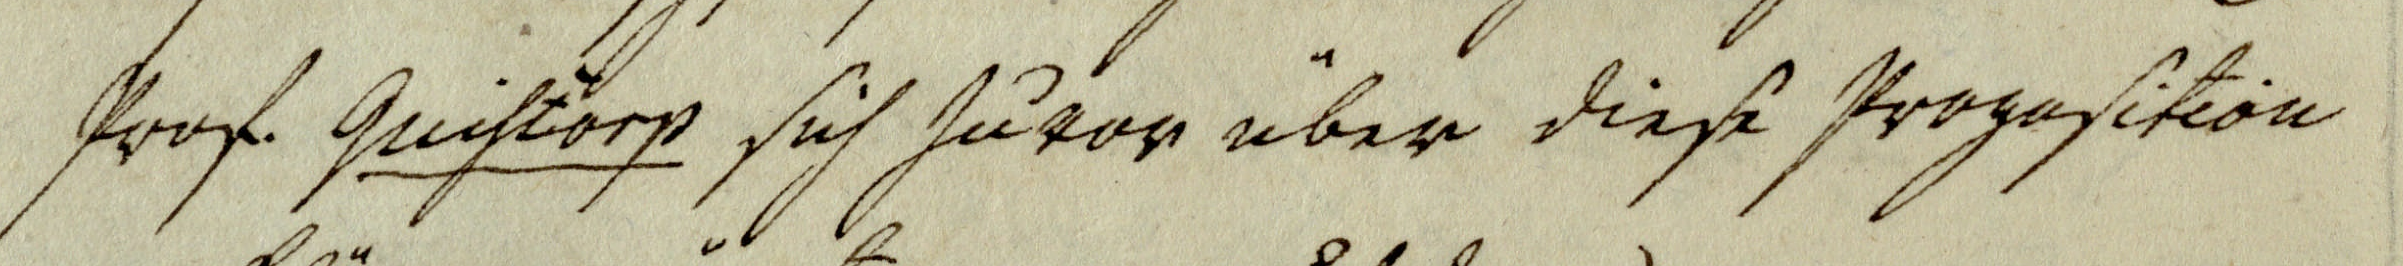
Prof. Quistorp sich zuvor über diese Proposition
